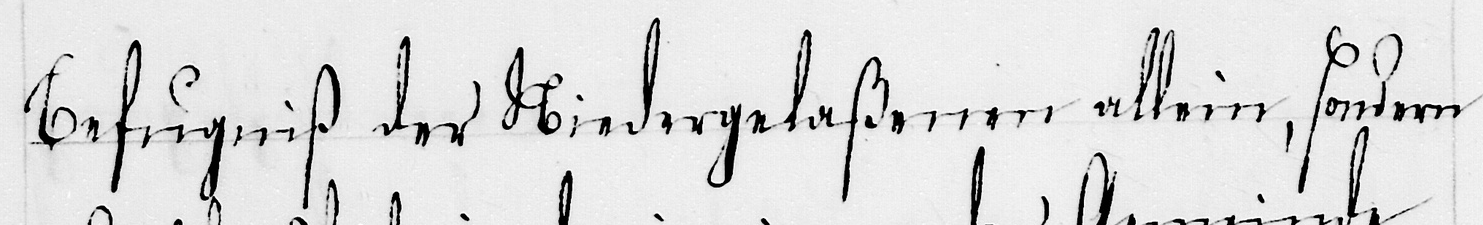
Befugniß der Niedergelaßenen allein, sondern
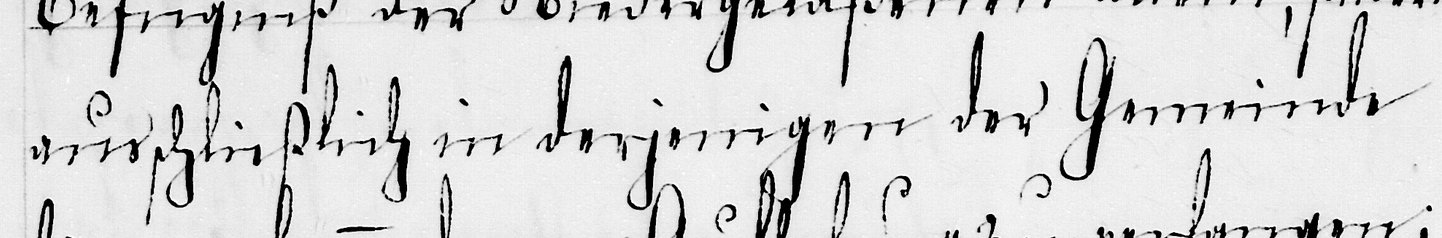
ausschließlich in derjenigen der Gemeinde
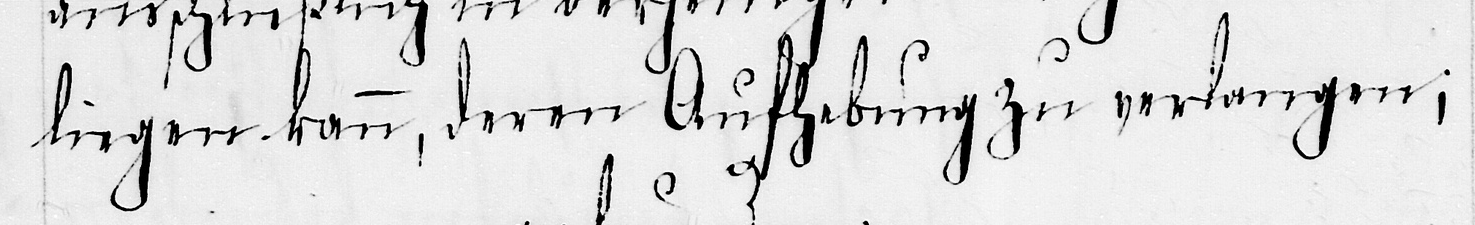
liegen kann, deren Aufhebung zu verlangen;
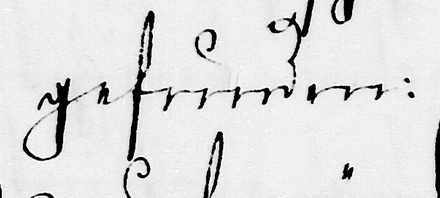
gefunden:
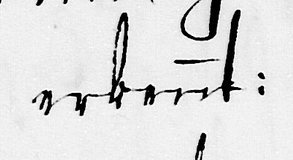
erkennt:
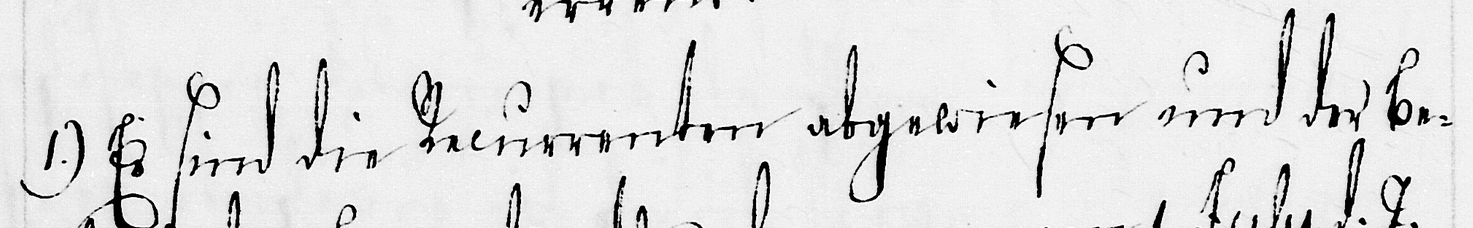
1.) Es sind die Recurrenten abgewiesen und der Be¬
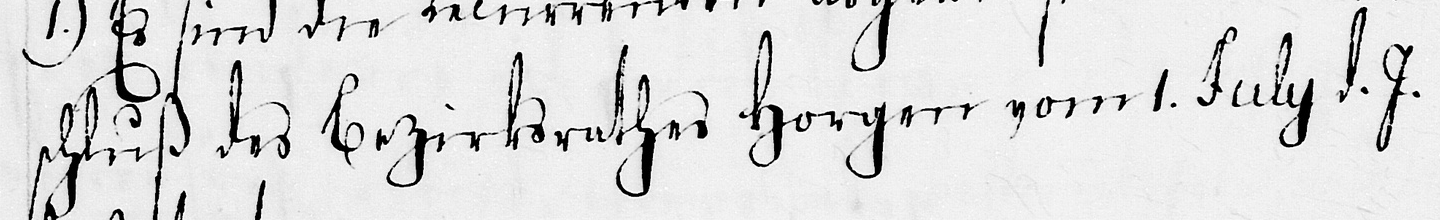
schluß des Bezirksrathes Horgen vom 1. July d. J.
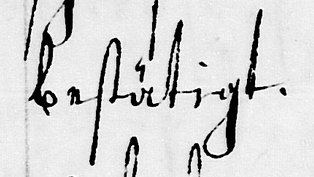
bestätigt.
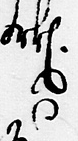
1.
